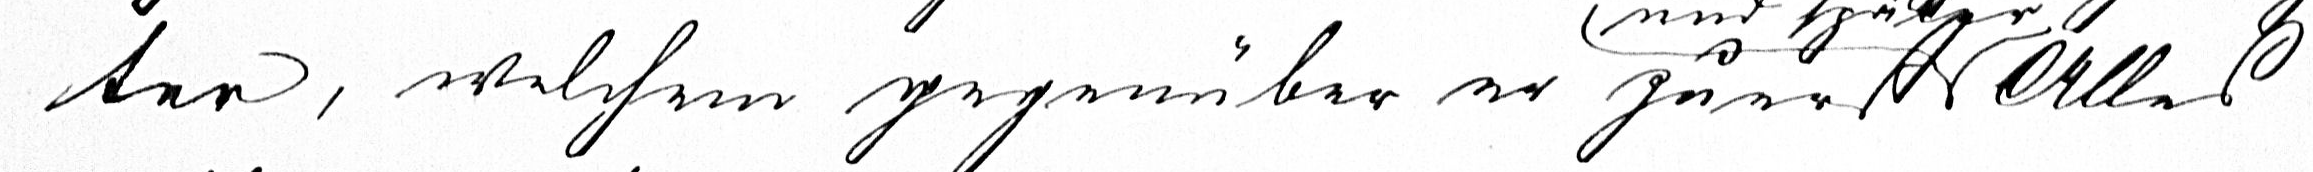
ter, welchem gegenüber er zuerst Alles
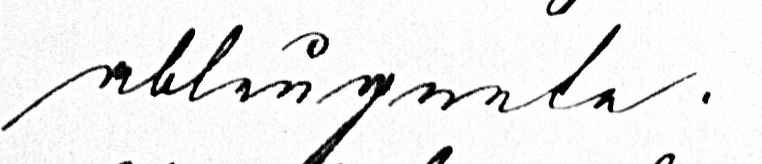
ableugnete.
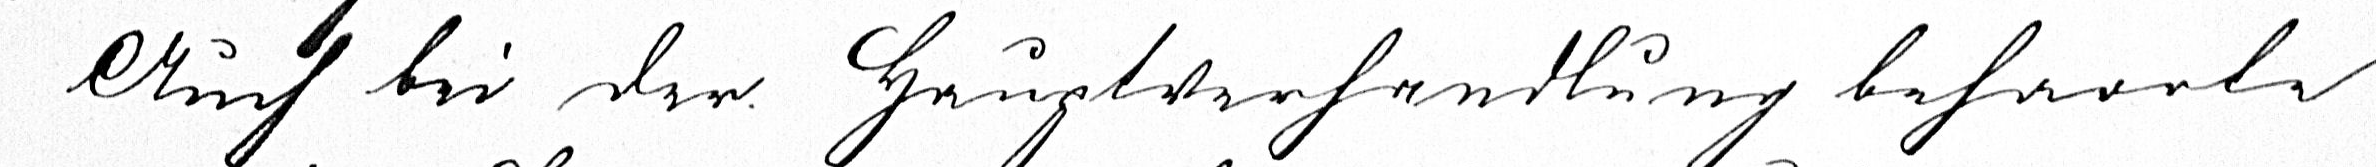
Auch bei der Hauptverhandlung beharrte
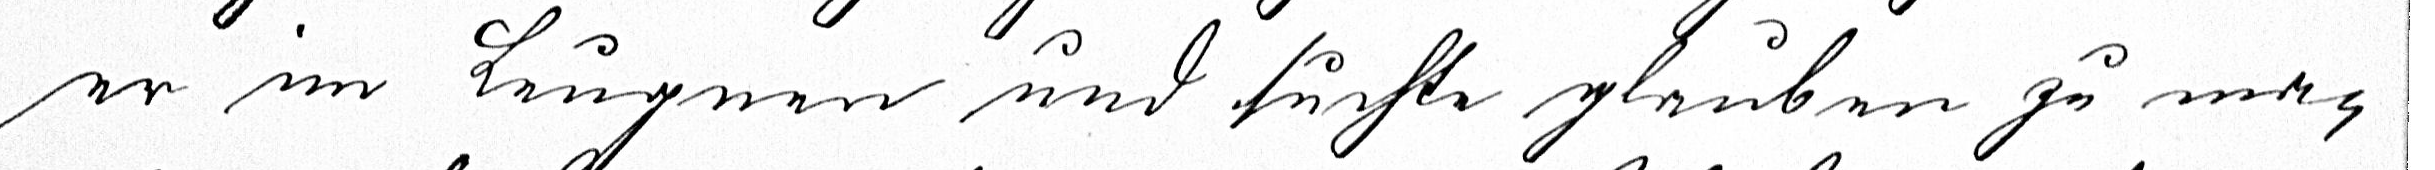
er im Leugnen und suchte glauben zu ma¬
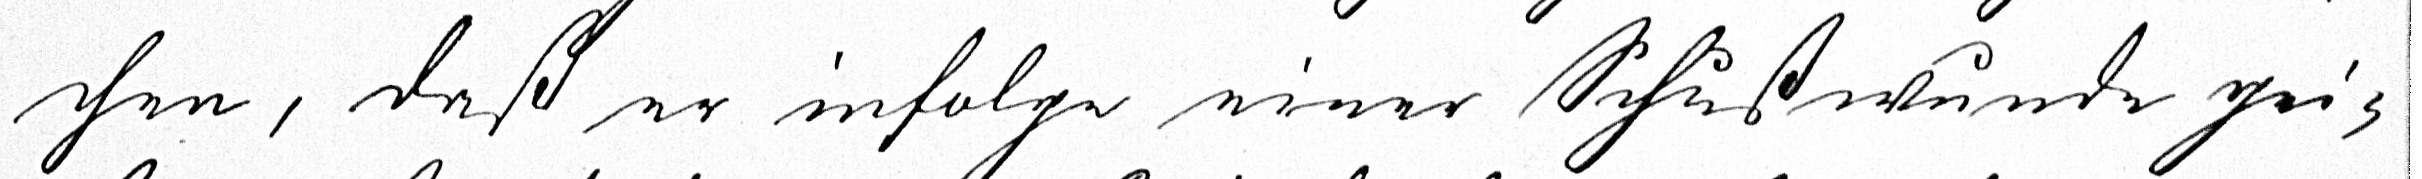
chen, daß er infolge einer Schuß wunde gei¬
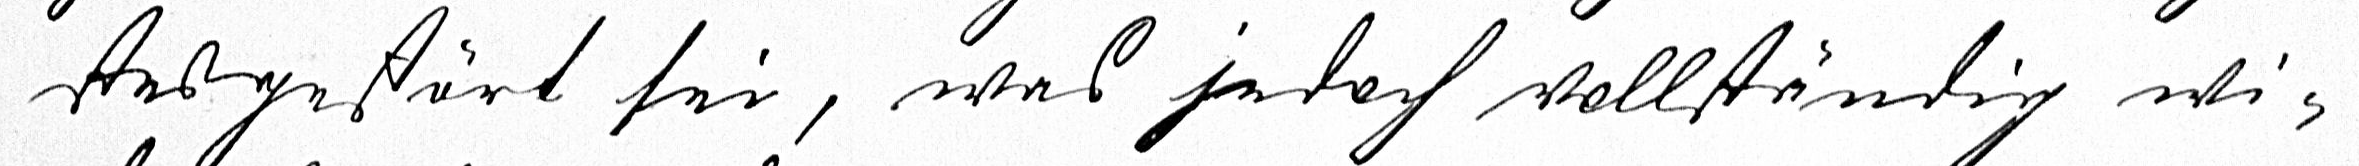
stesgestört sei, was jedoch vollständig wi¬
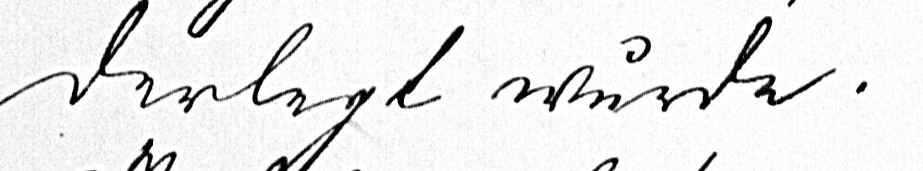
derlegt wurde.
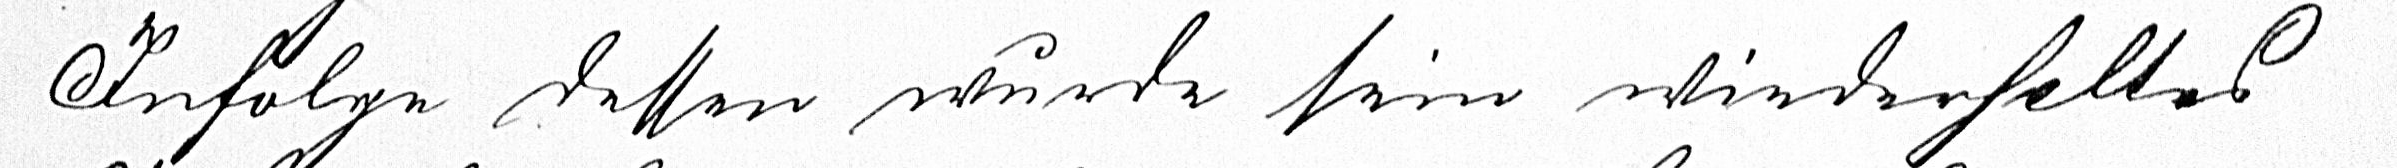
Infolge dessen wurde sein wiederholtes
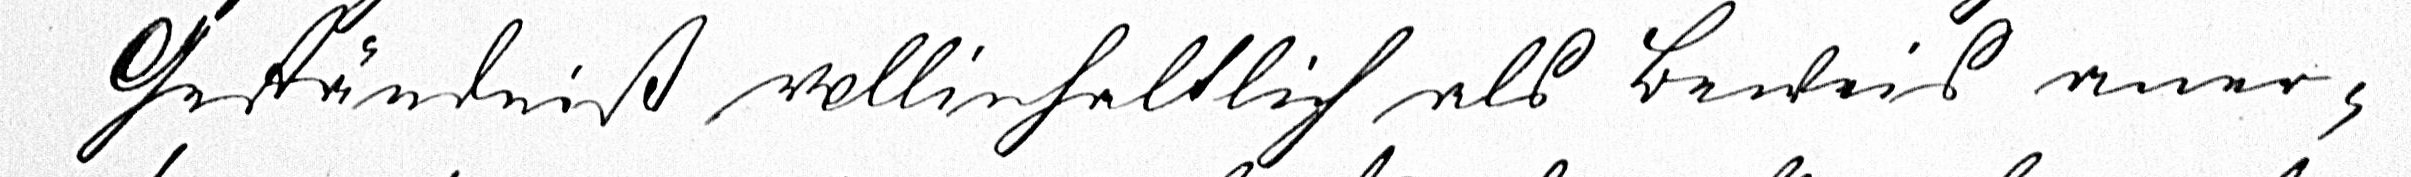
Geständniß vollinhaltlich als Beweis aner¬
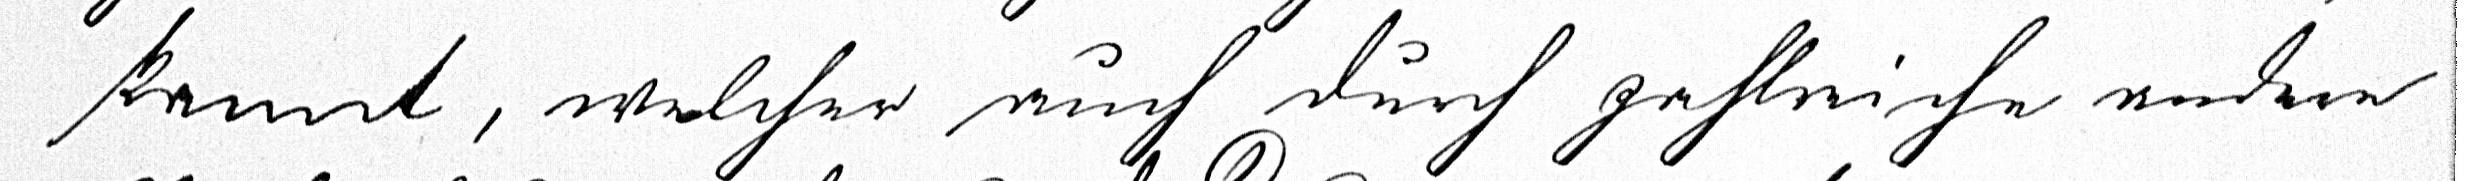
kannt, welcher auch durch zahlreiche andern
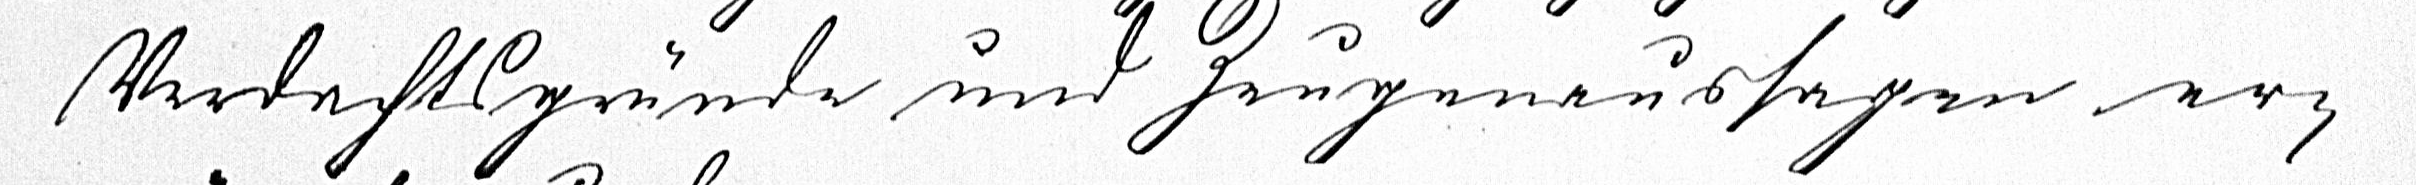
Verdachtsgründe und Zeugenaussagen er¬
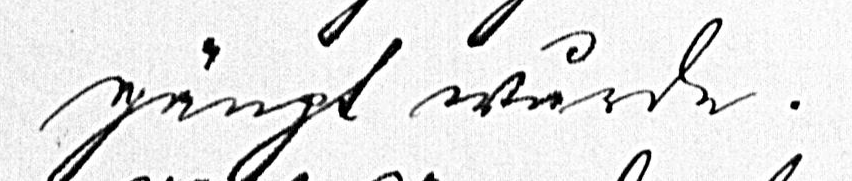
gängt wurde.
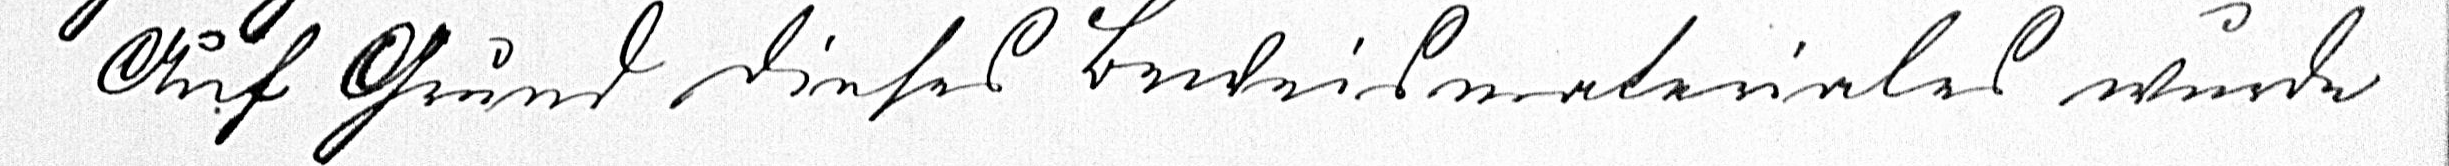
Auf Grund dieses beweismateriales wurde
